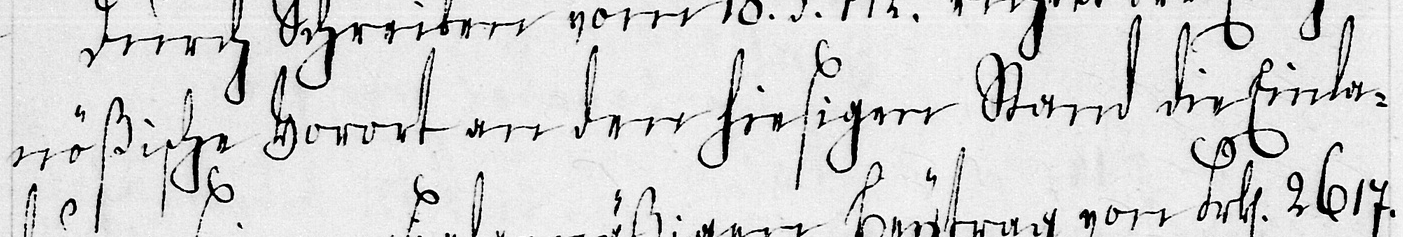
nößische Vorort an den hiesigen Stand die Einla¬
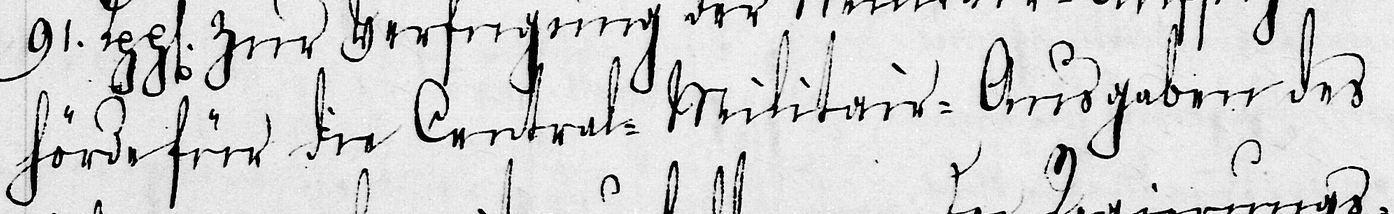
hörde für die Central-Militair-Ausgaben des
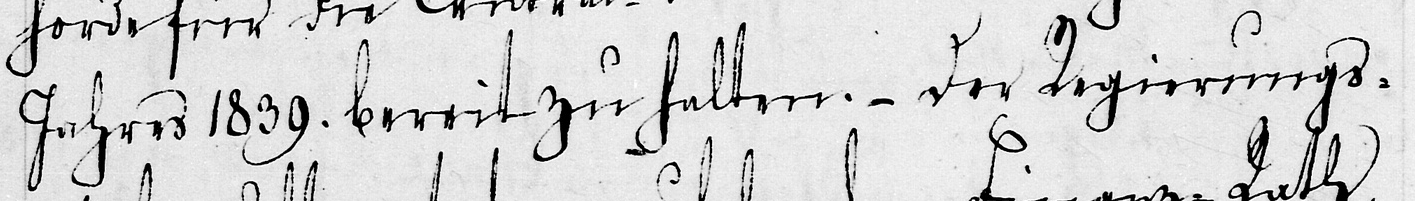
Jahres 1839. bereit zu halten. – Der Regierungs¬
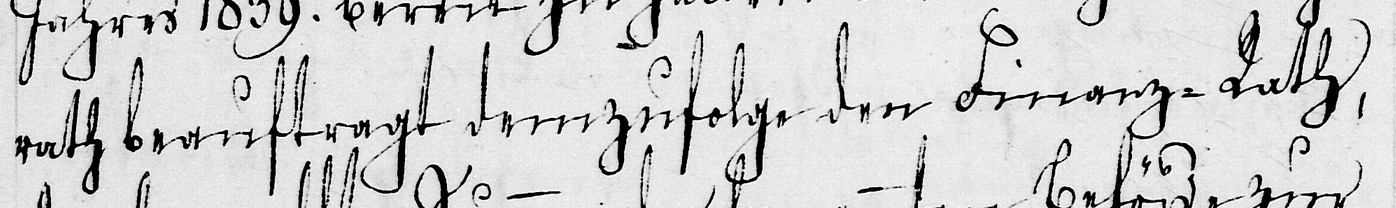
rath beauftragt demzufolge den Finanz-Rath,
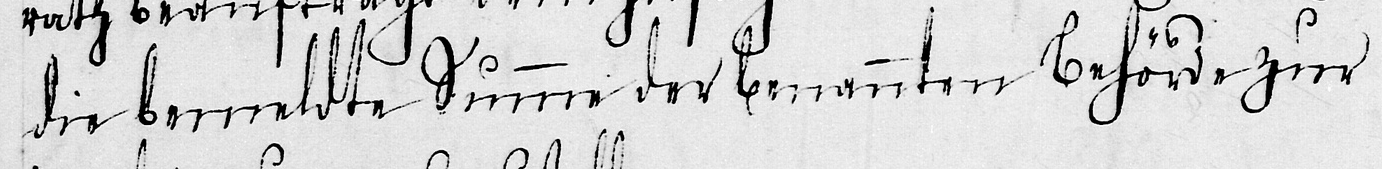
die bemeldte Summe der benannten Behörde zu
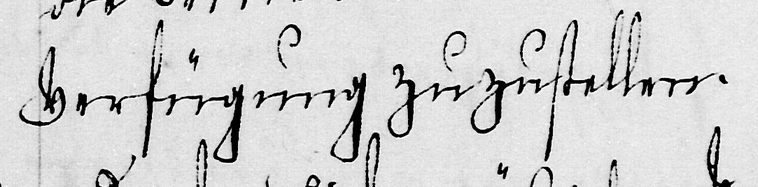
Verfügung zuzustellen.
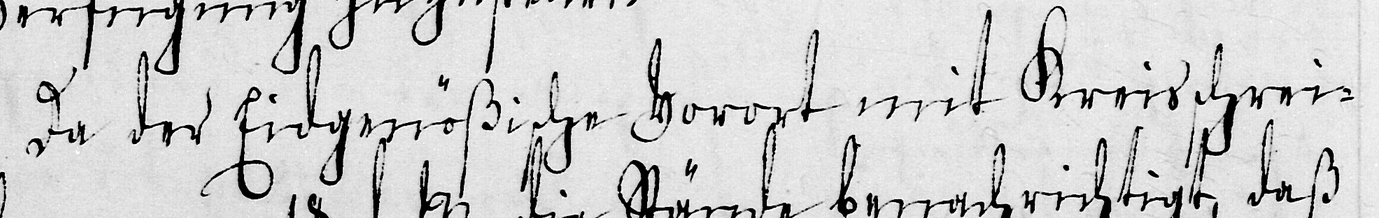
Da der Eidgenößische Vorort mit Kreisschrei¬
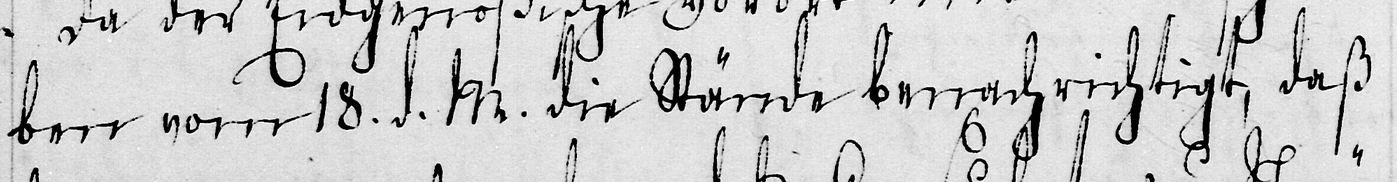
ben vom 18. d. M. die Stände benachrichtigt, daß
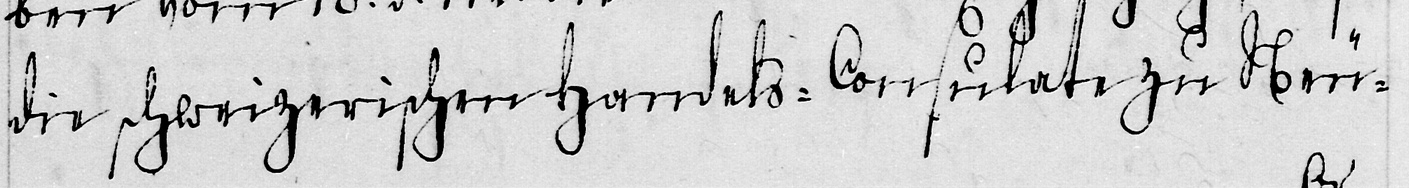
die schweizerischen Handels-Consulate zu Neu-
